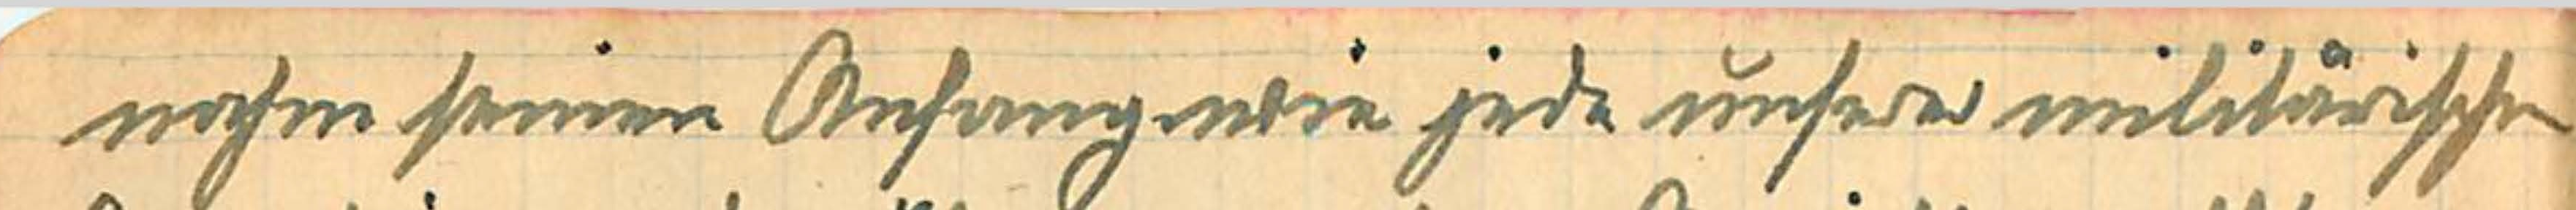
nahm seinen Anfang wie jede unserer militärischen
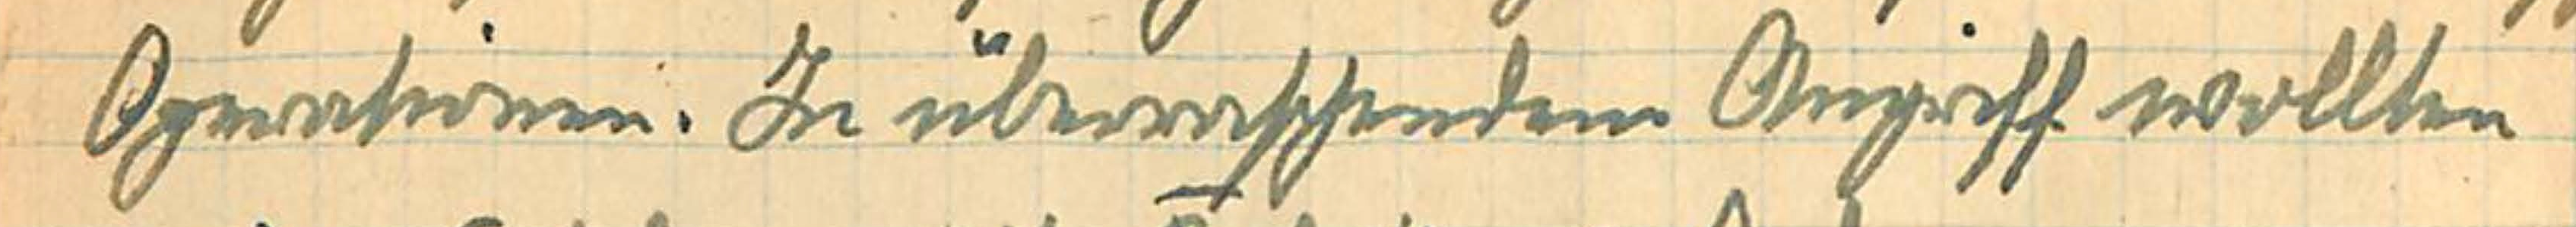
Operationen. In überraschendem Angriff wollten
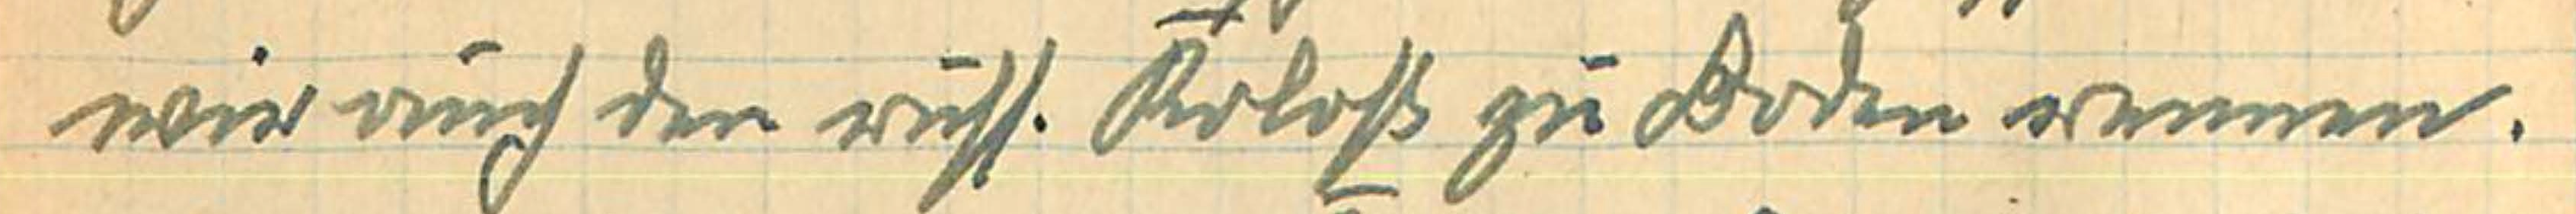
wir auch den russ. Koloß zu Boden rennen.
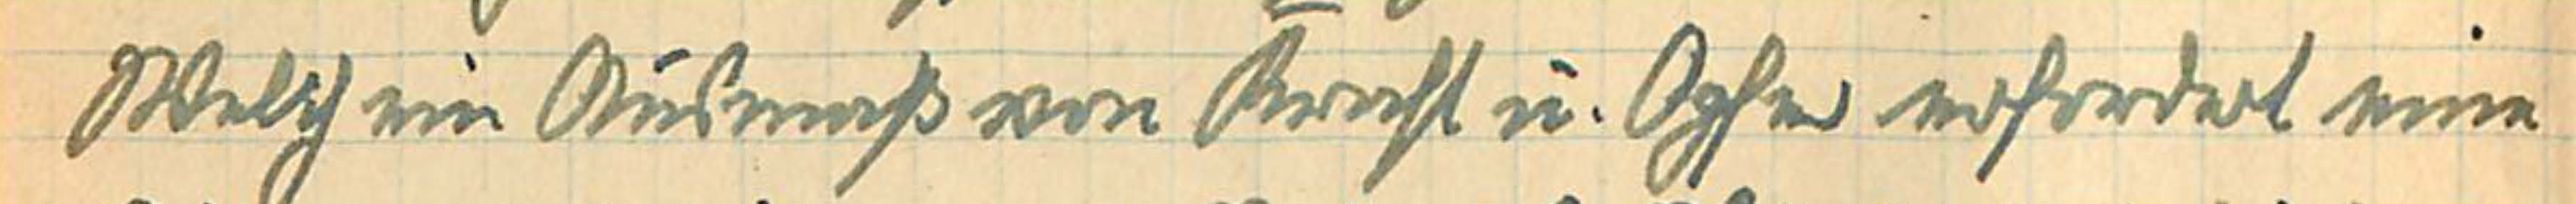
Welch ein Ausmaß von Kraft u. Opfer erfordert eine
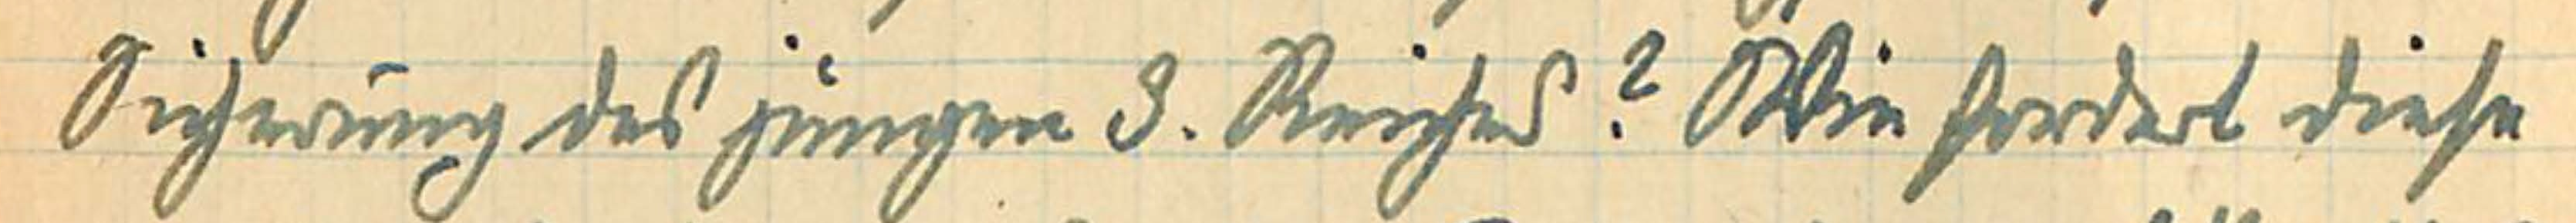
Sicherung des jungen 3. Reiches? Wie fordert diese
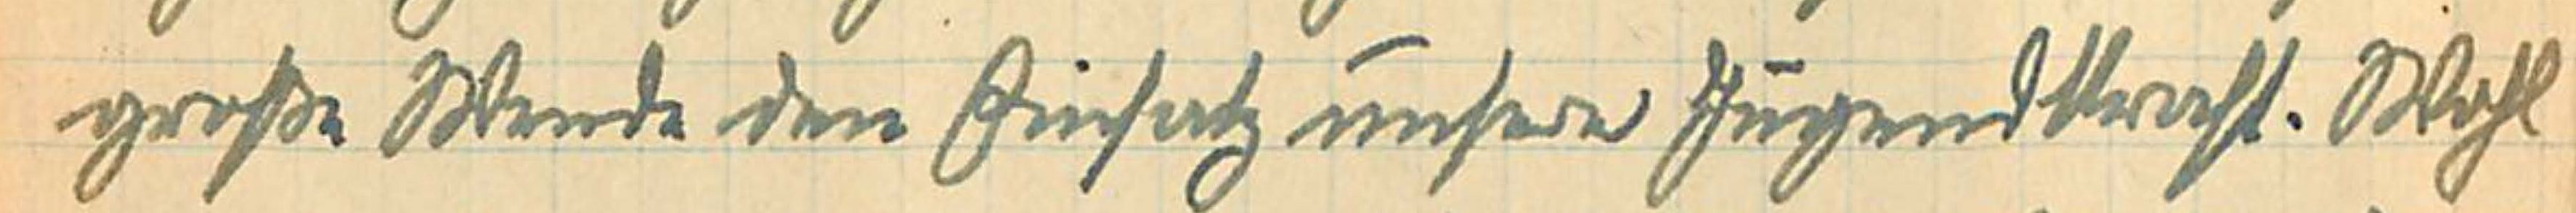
große Wende den Einsatz unserer Jugendkraft. Wohl
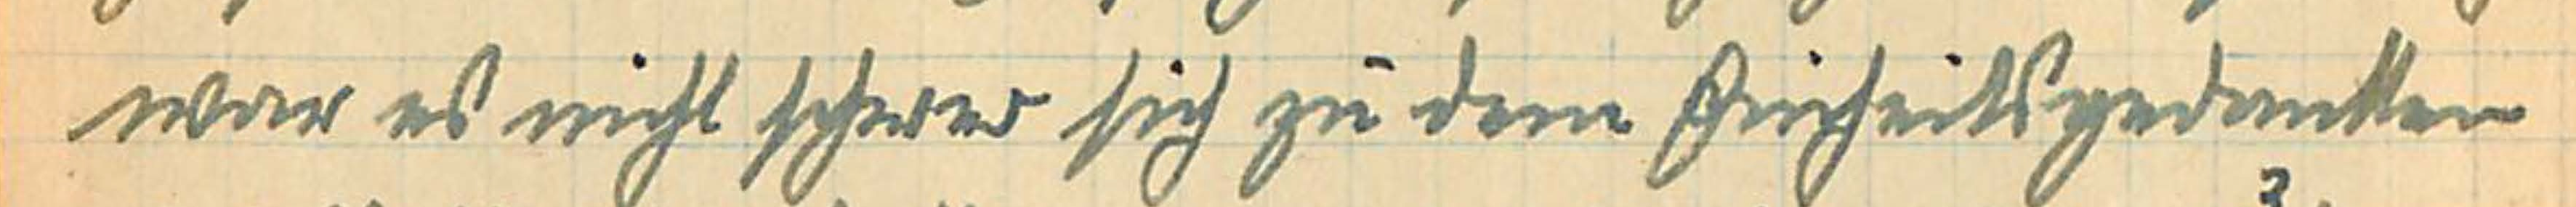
war es nicht schwer sich zu dem Einheitsgedanken
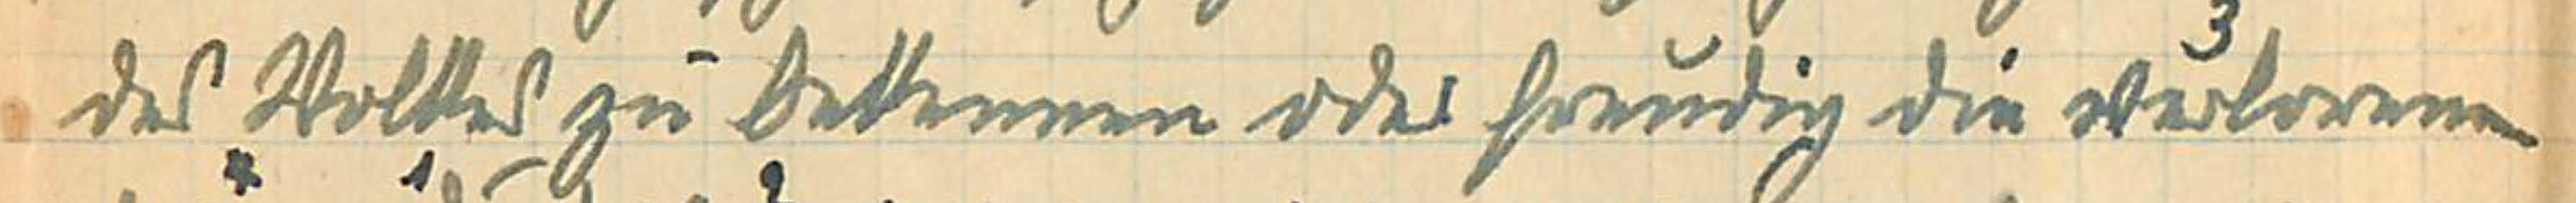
des Volkes zu bekennen oder freudig die 3verlorenen
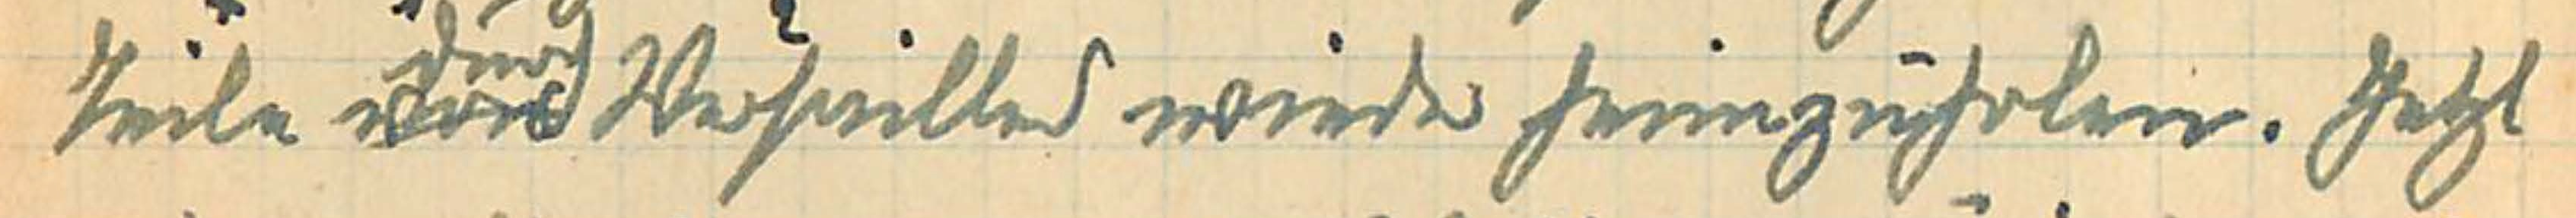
4Teile 1durch von 2Versailles wieder heimzuholen. Jetzt
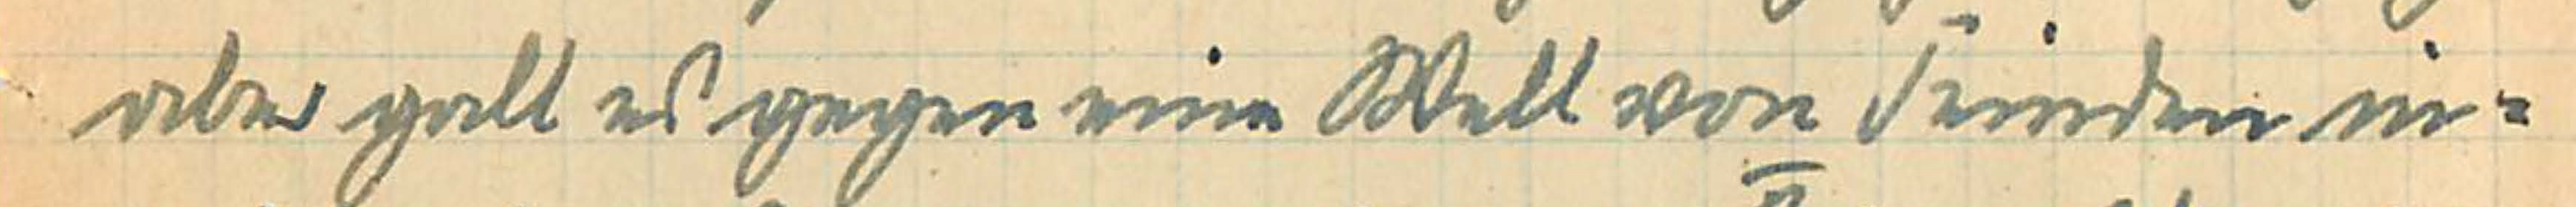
aber galt es gegen eine Welt von Feinden in-
